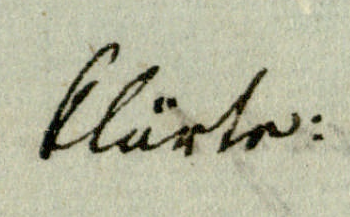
klärte:
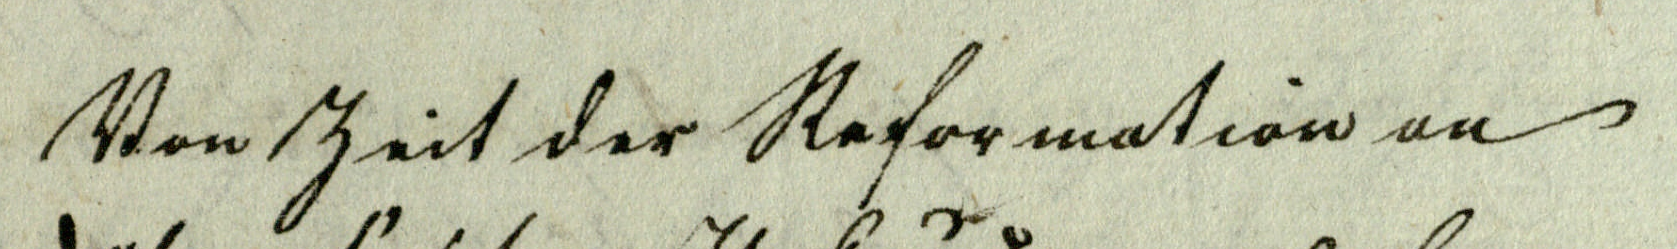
Von Zeit der Reformation an
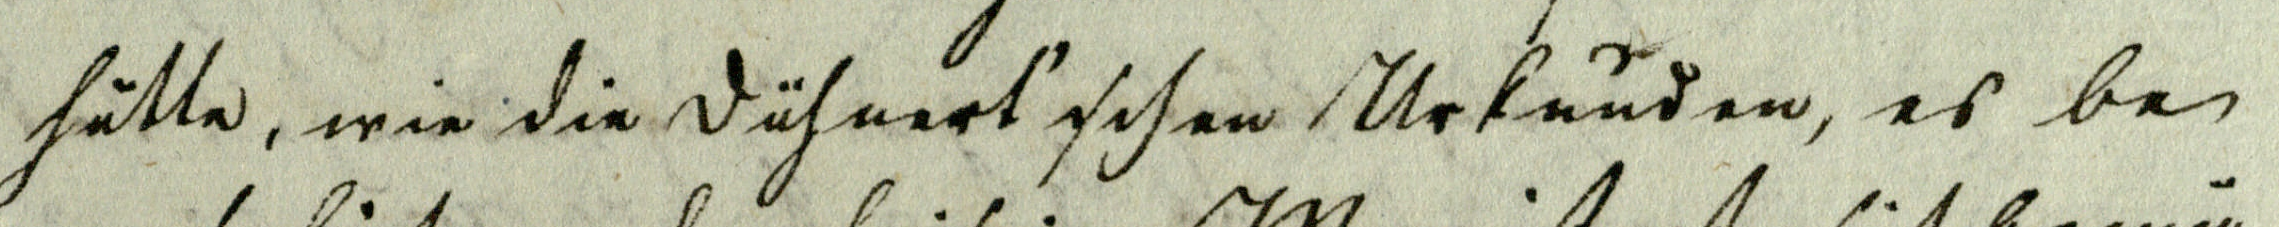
hätte, wie die Dähnert'schen Urkunden, es be¬
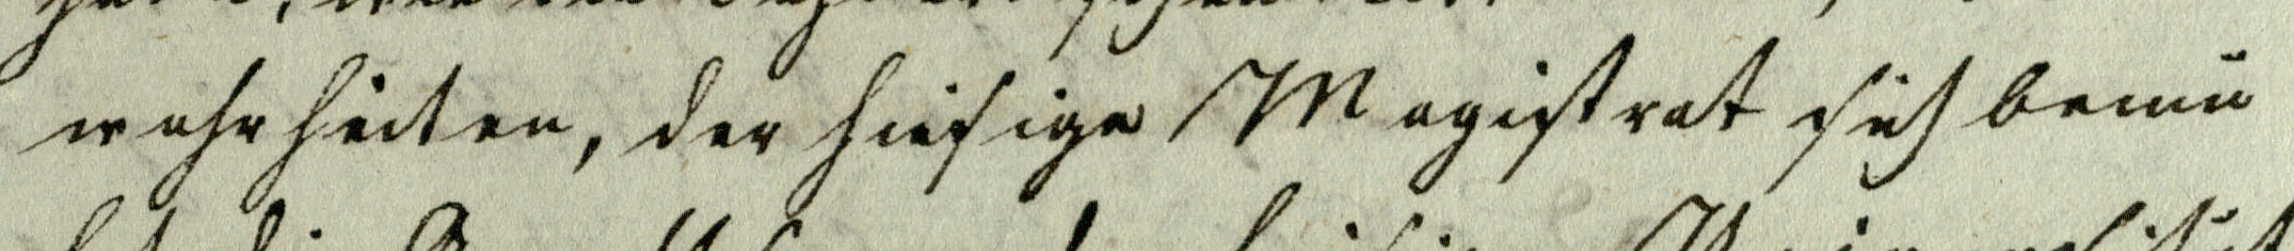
wahrheiten, der hiesige Magistrat sich bemü¬
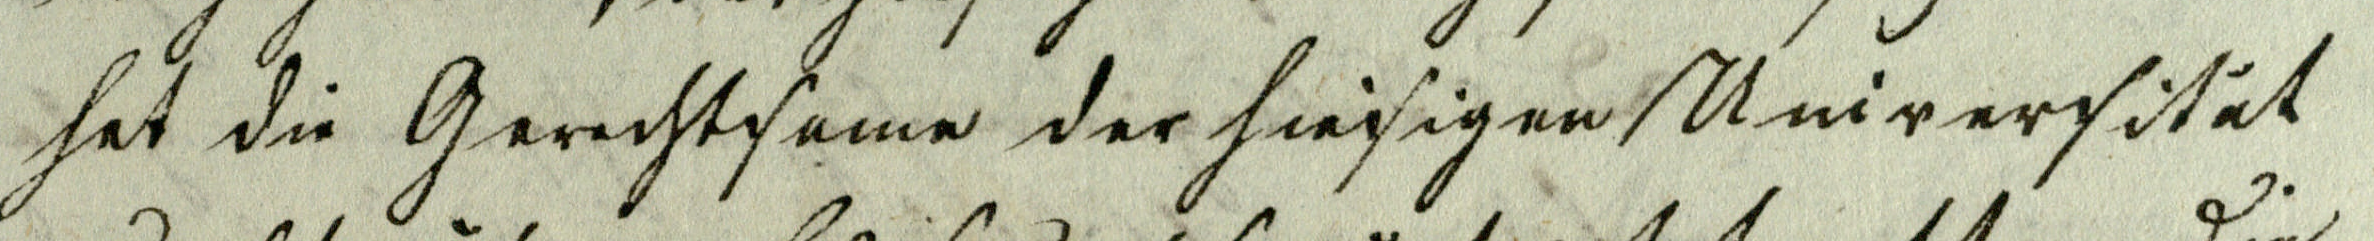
het die Gerechtsame der hiesigen Universität
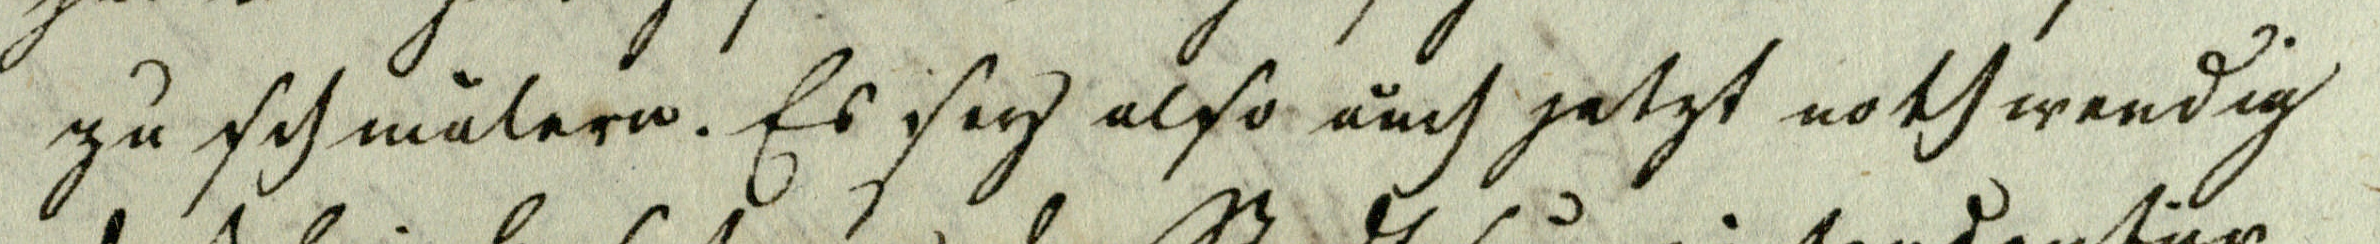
zu schmälern. Es sey also auch jetzt nothwendig
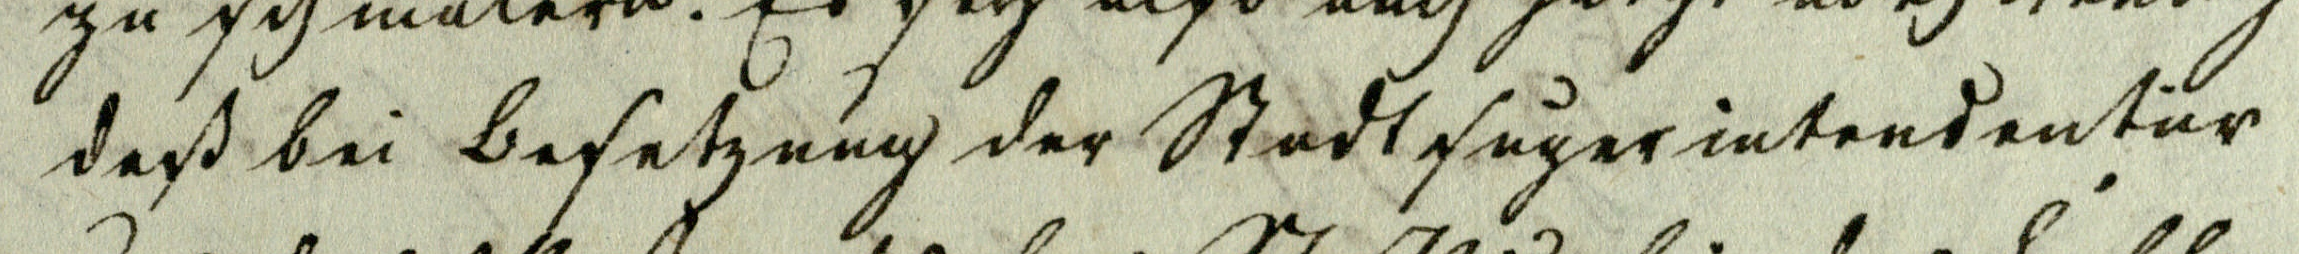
daß bei Besetzung der Stadt super intendentur
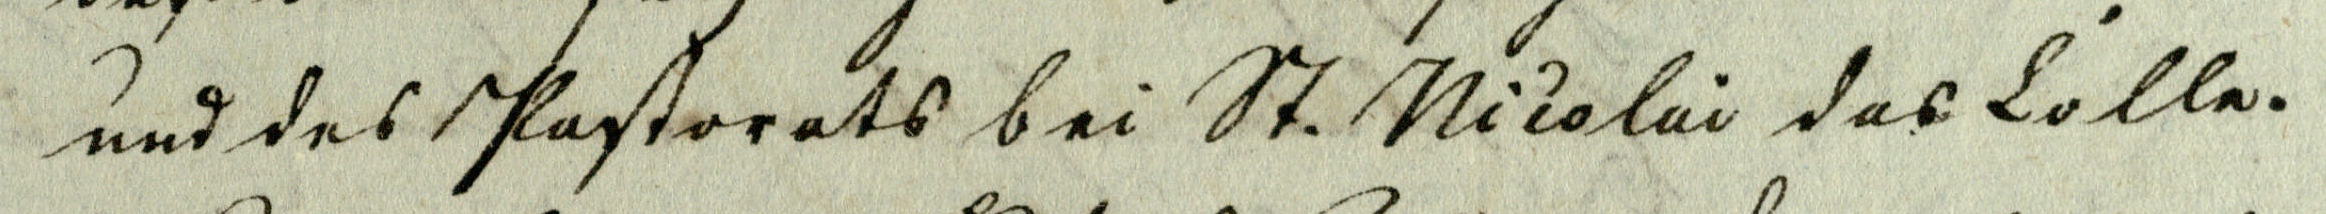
und des Pastorats bei St. Nicolai das Colle¬
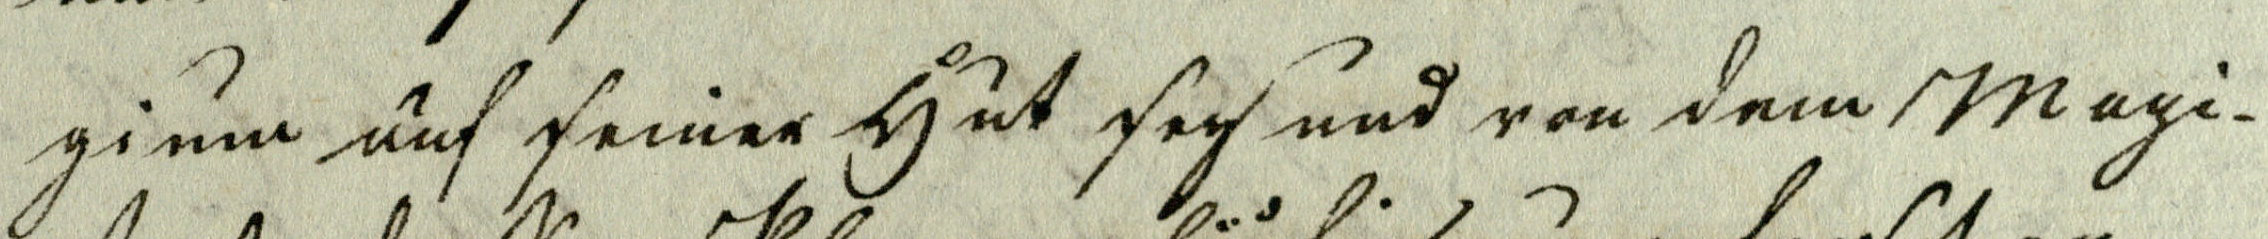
gium auf seiner Hut sey und von dem Magi¬
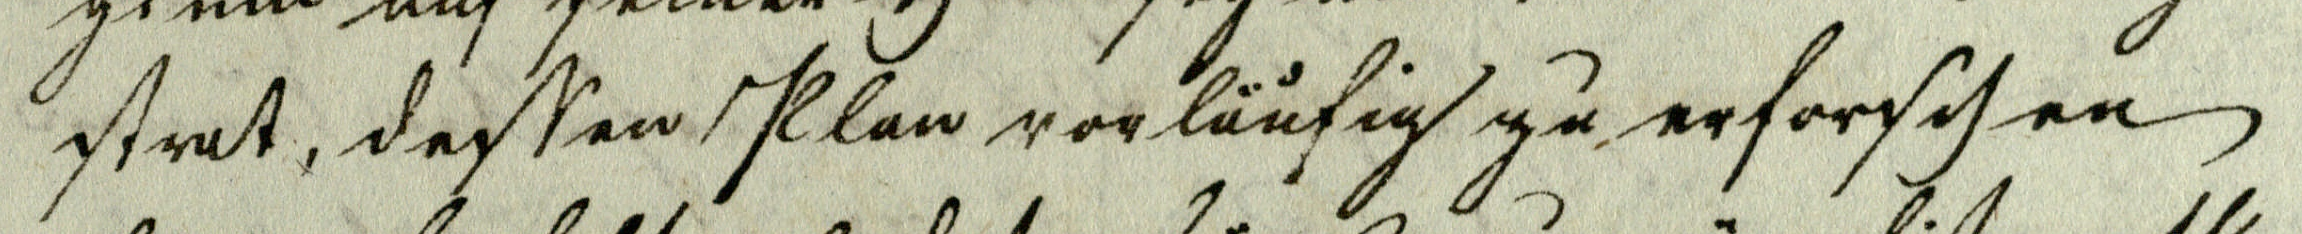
strat, dessen Plan vorläufig zu erforschen
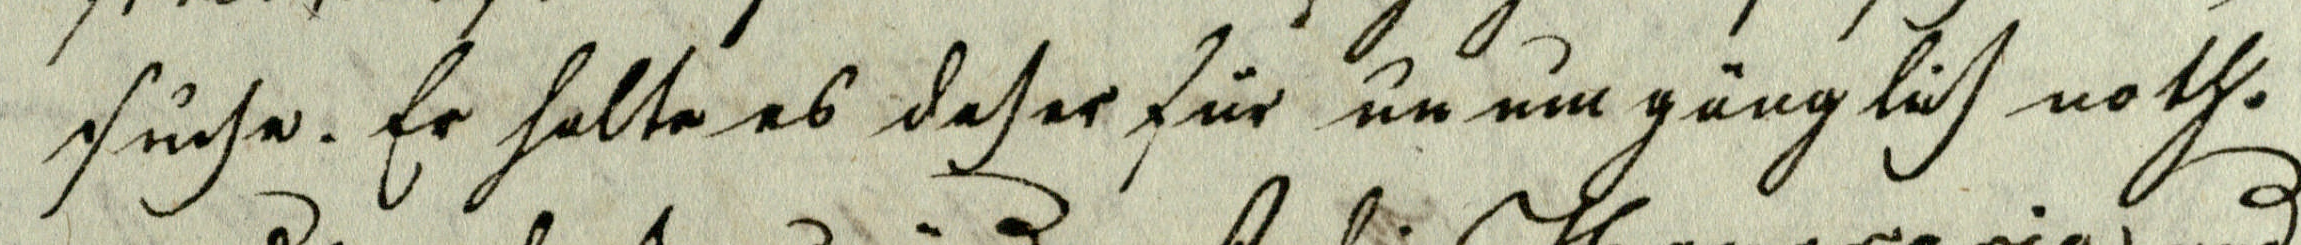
suche. Er halte es daher für un um gänglich noth¬
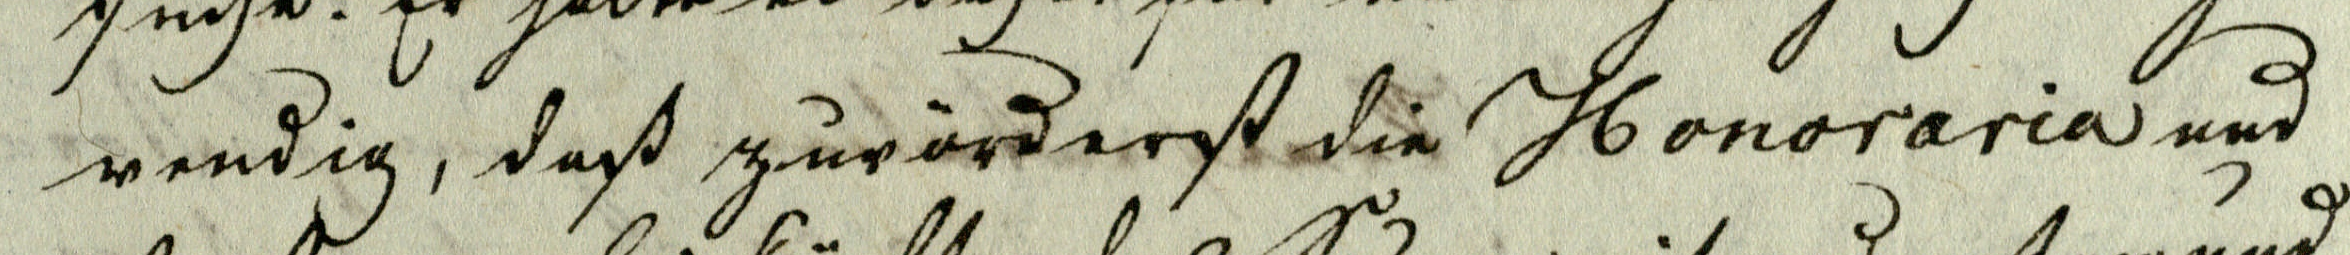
wendig, daß zuvörderst die Honoraria und
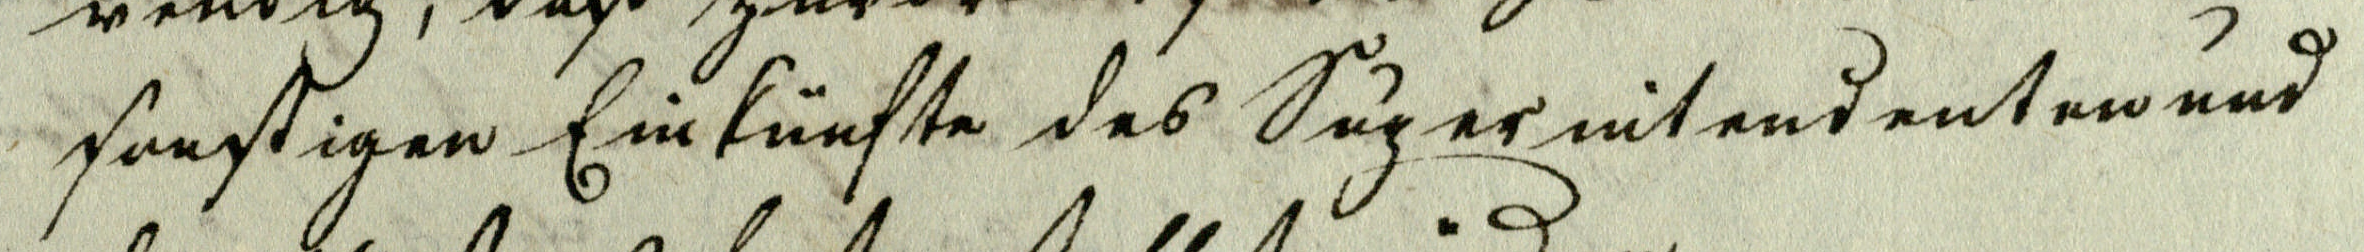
sonstigen Einkünfte des Superintendenten und
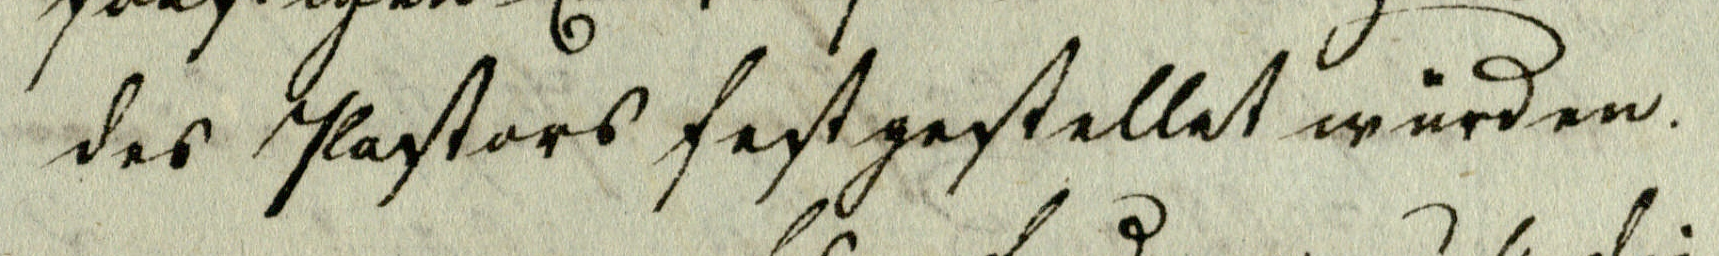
des Pastors fesgestellet würden.
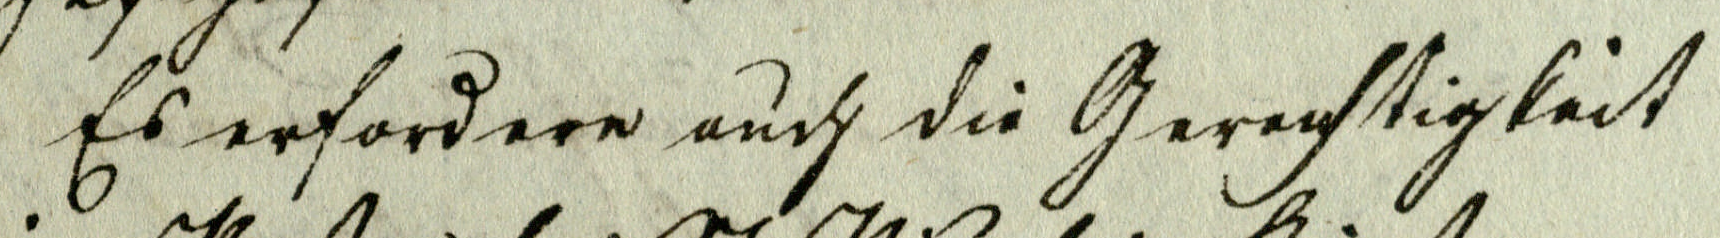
Es erfordere auch die Gerechtigkeit
